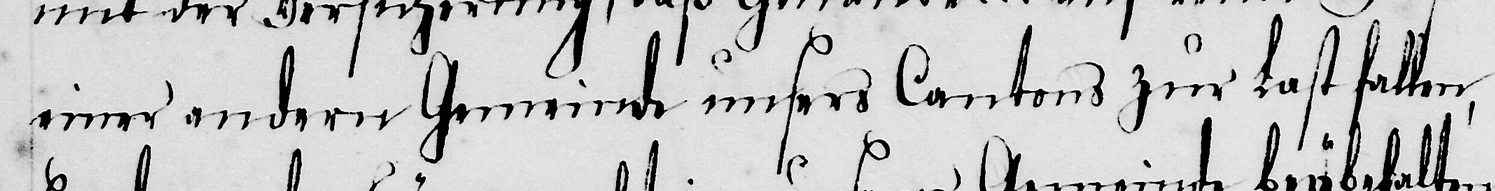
einer andern Gemeinde unsers Cantons zur Last falle¬
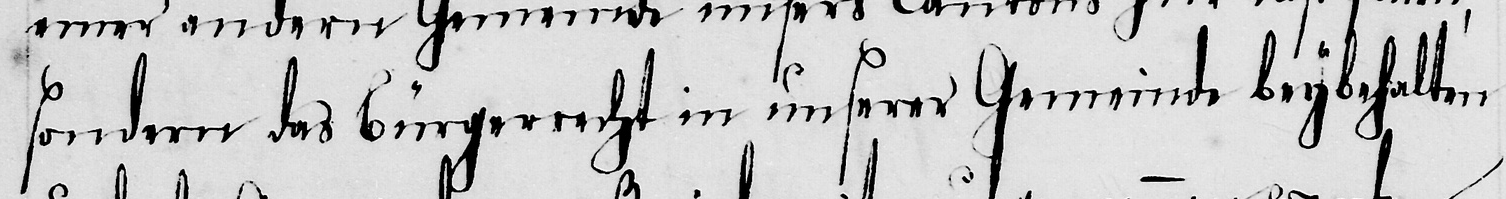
sondern das Bürgerrecht in unserer Gemeinde beybehalten
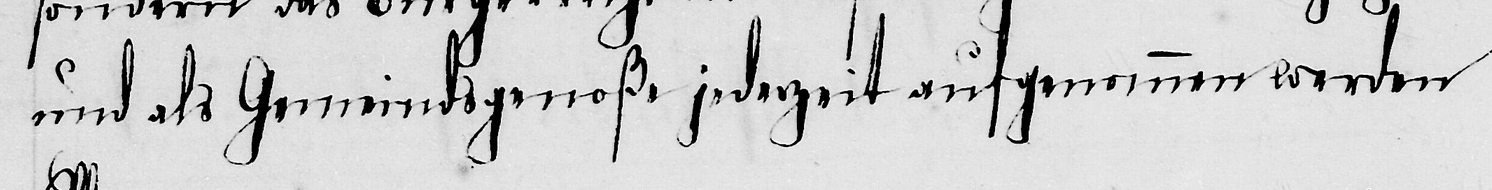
und als Gemeindsgenoße jederzeit aufgenommen werden
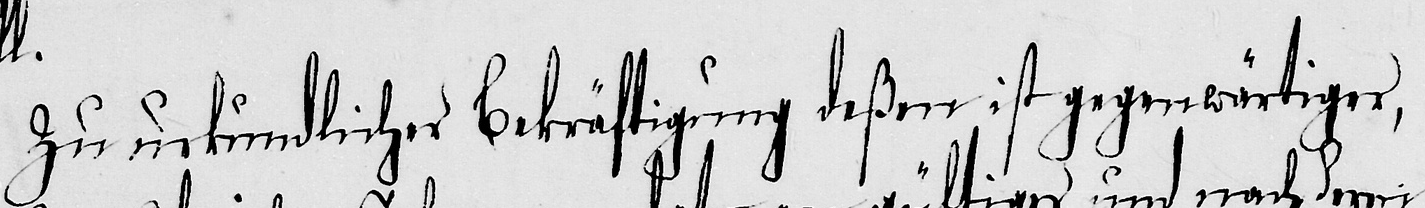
Zu urkundlicher Bekräftigung deßen ist gegenwärtiger,
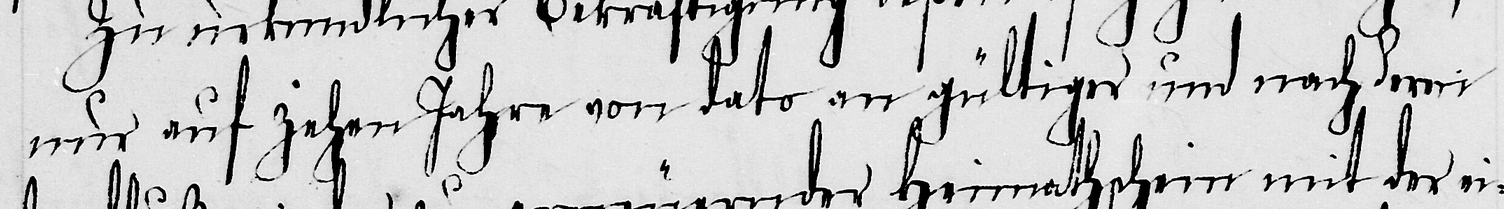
nur auf zehn Jahre von dato an gültiger und nach deren
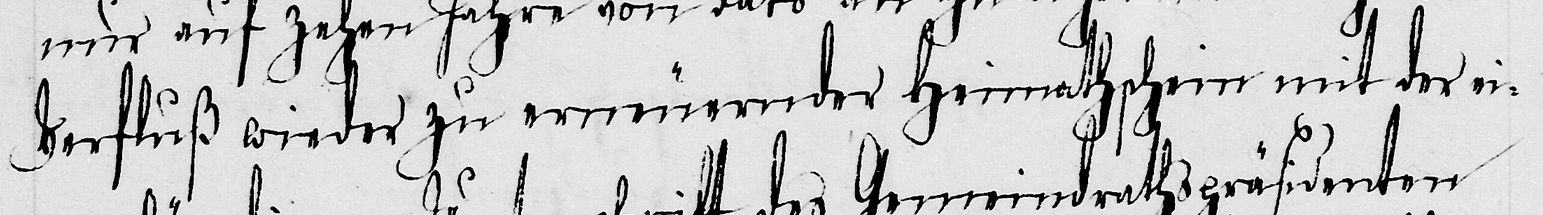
Verfluß wieder zu erneuernder Heimathschein mit der ei¬
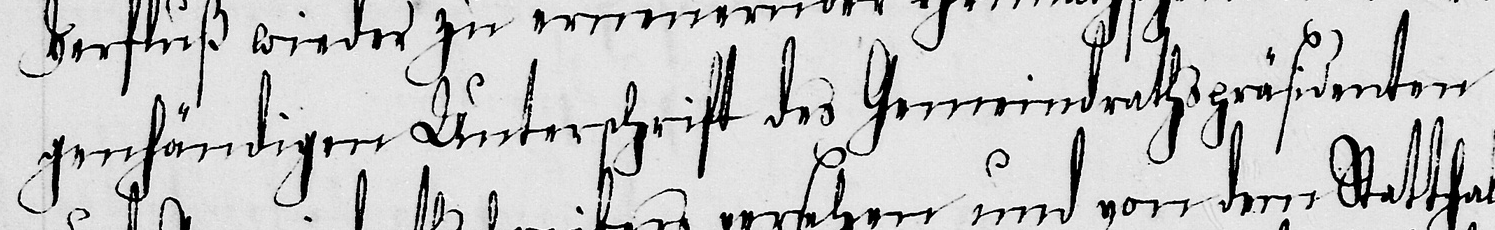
genhändigen Unterschrift des Gemeindrathspräsidenten
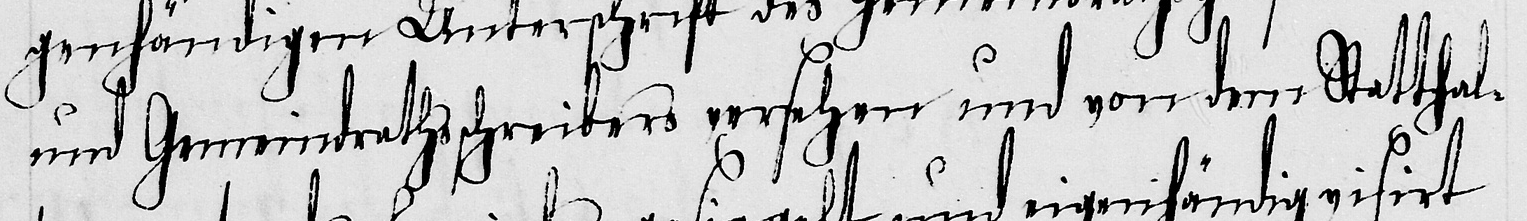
und Gemeindrathsschreibers versehen und von dem Statthal¬
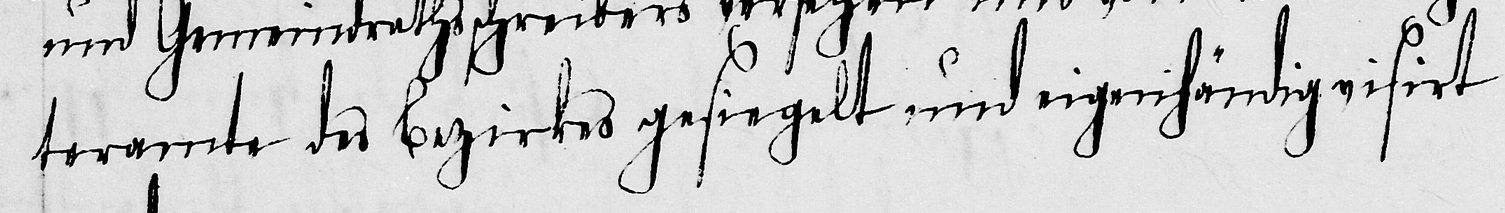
teramte des Bezirkes gesiegelt und eigenhändig visirt
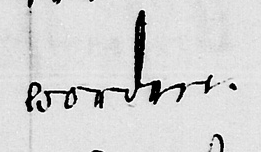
worden.
